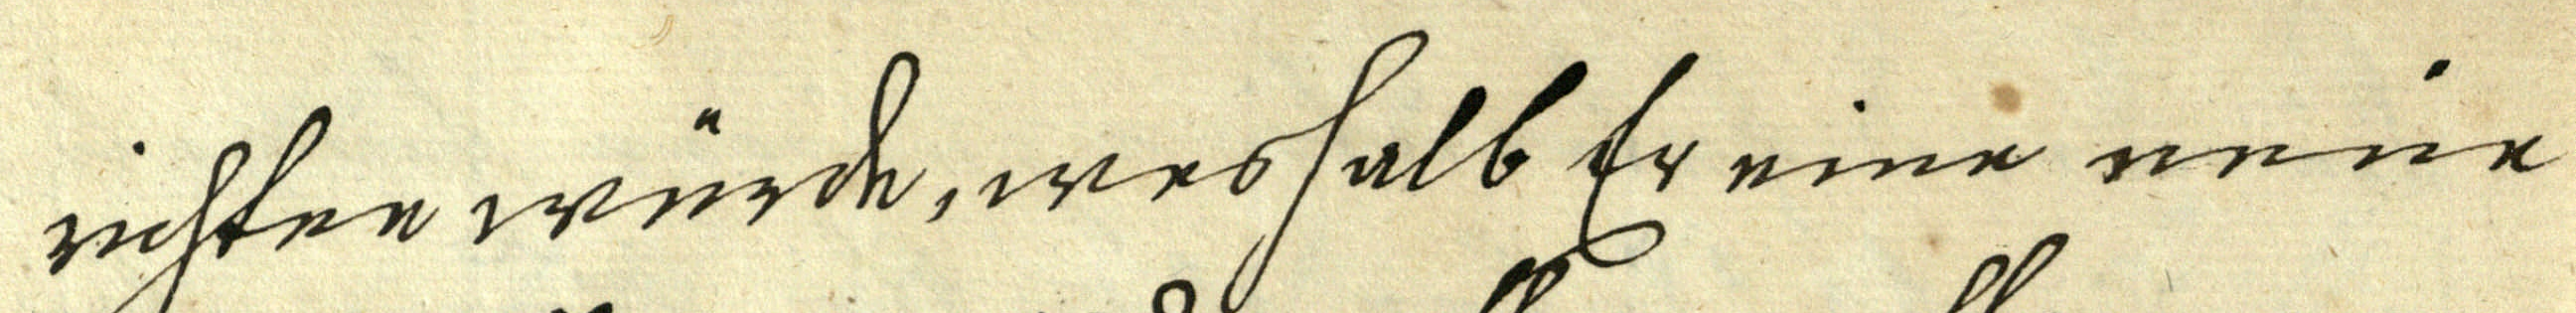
richten würde, weshalb Er eine neune
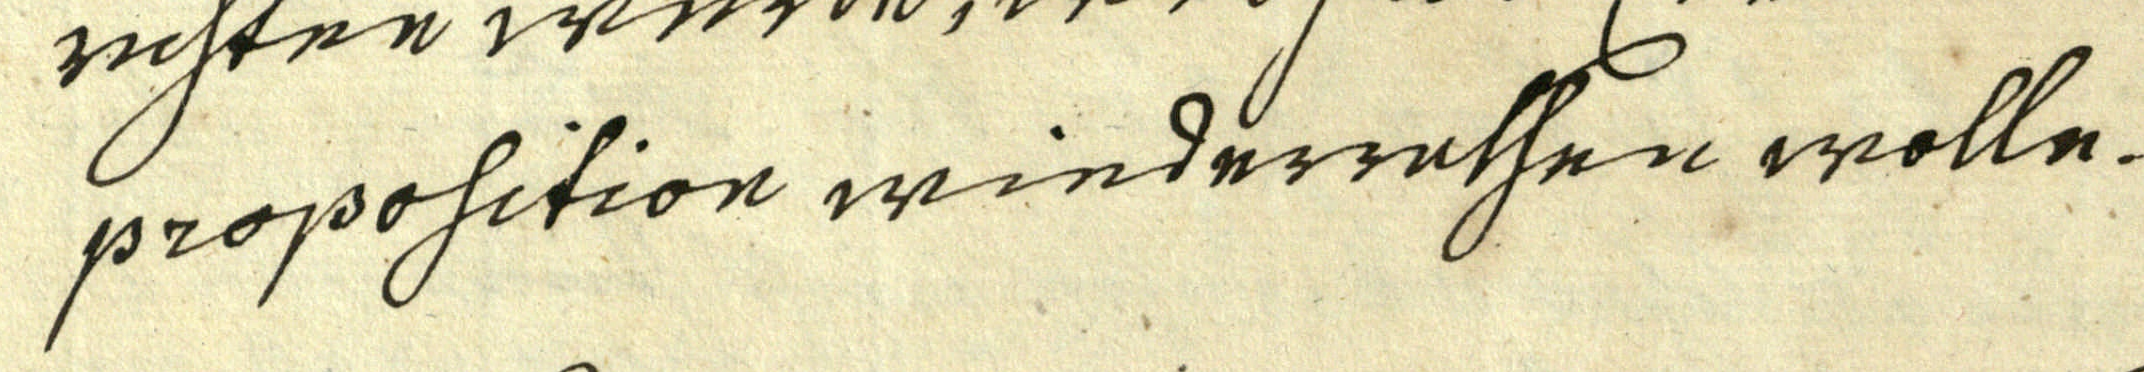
proposition wiederrathen wolle.
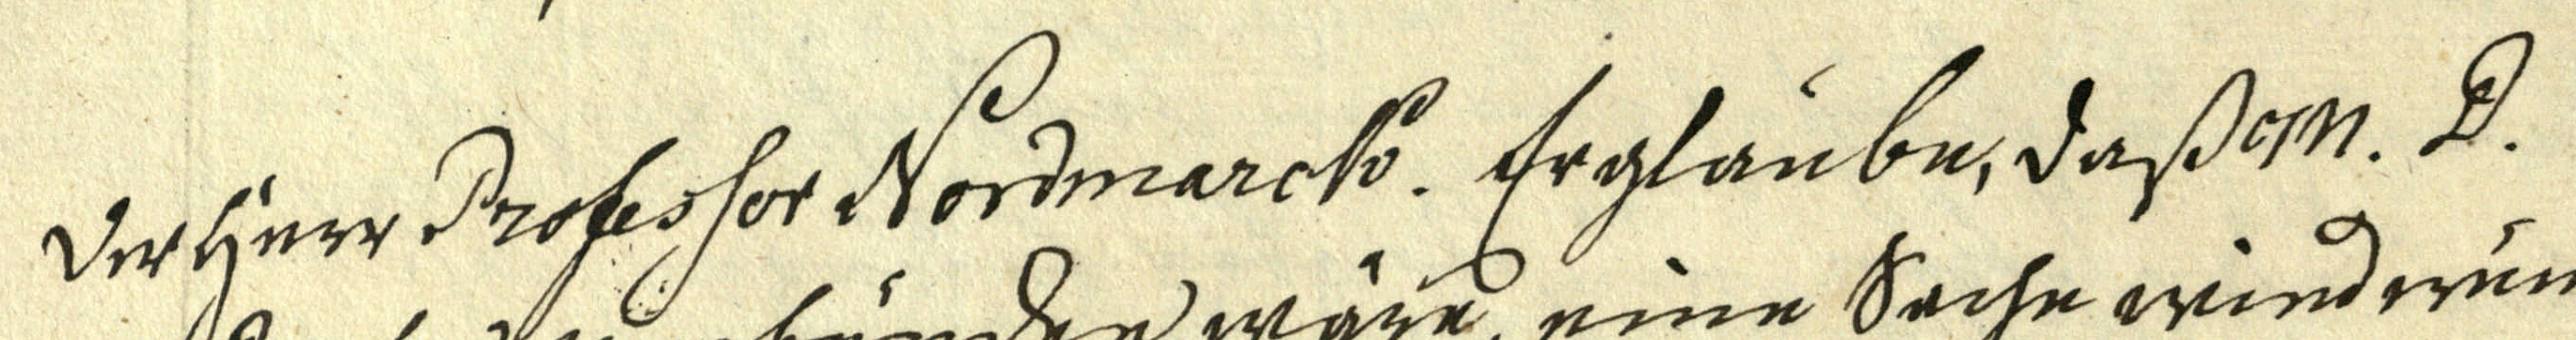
Der Herr Professor Nordmarck. Er glaube, daß M. D.
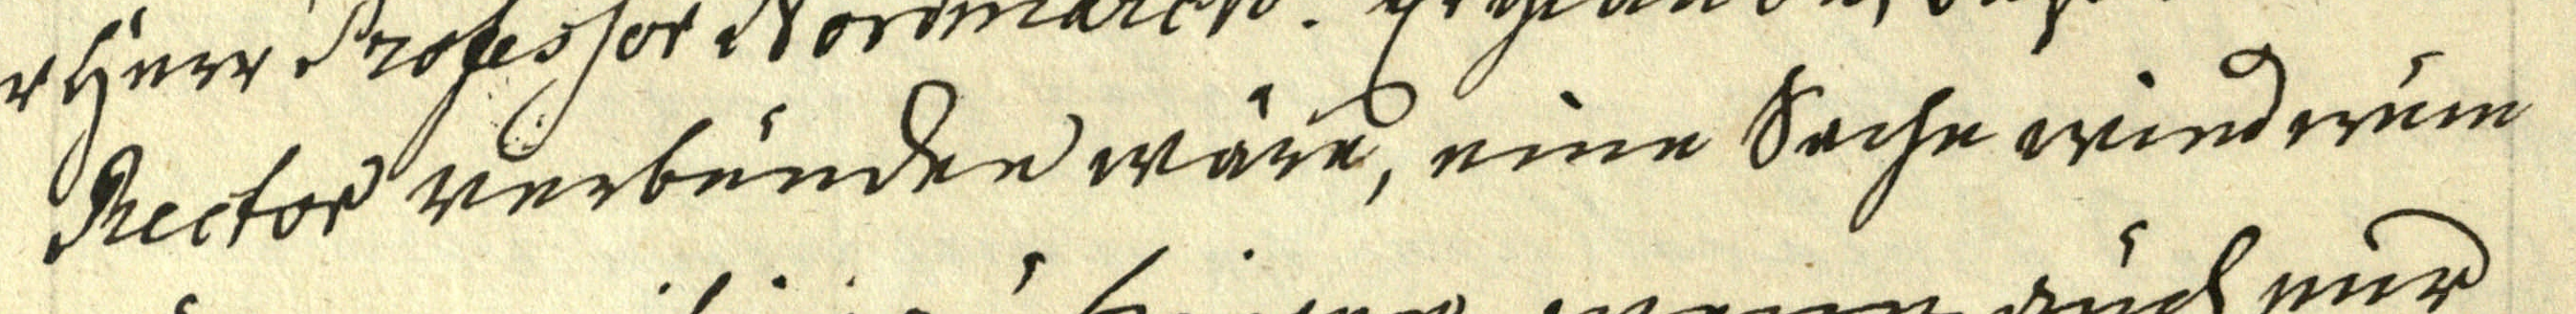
Rector verbunden wäre, eine Sache wiederum
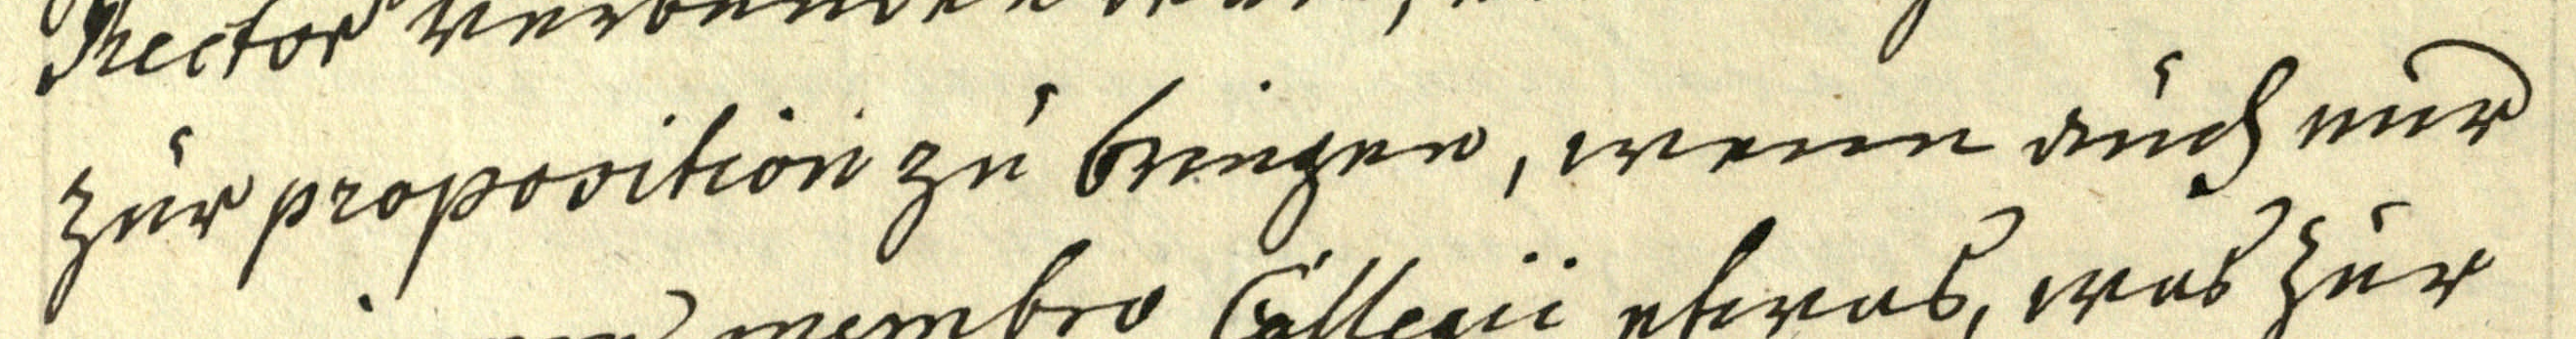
zur proposition zu bringen, wenn auch nur
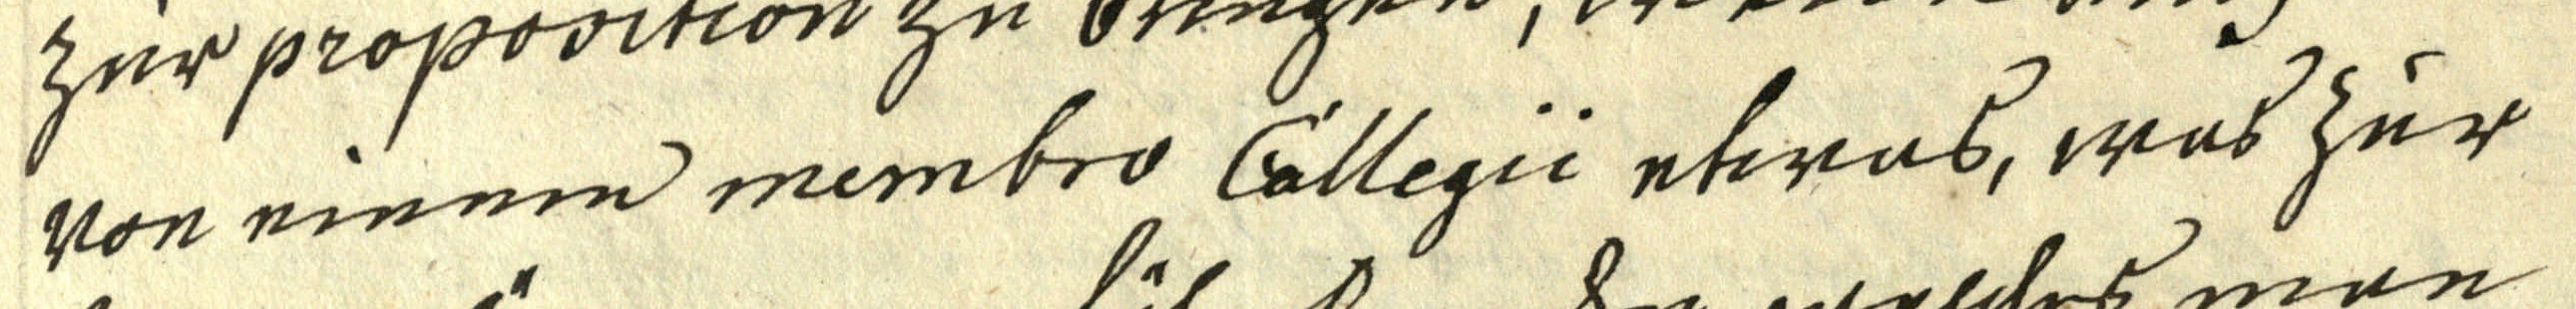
von einem membro Collegii etwas, was zur
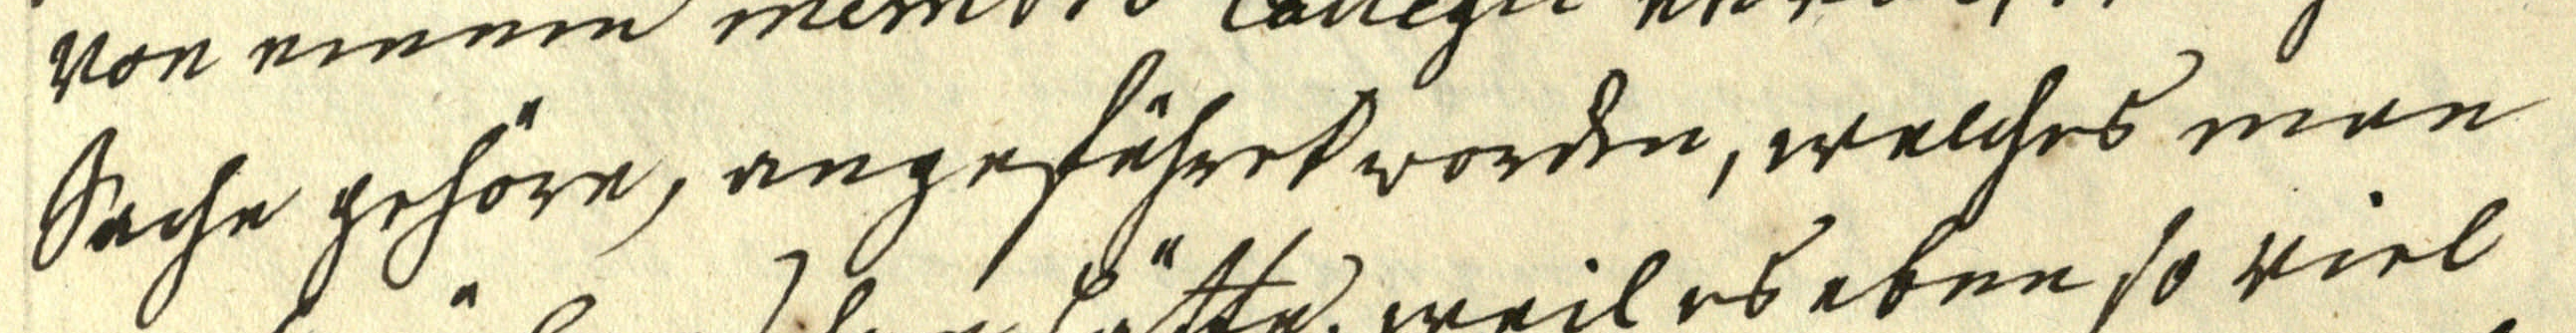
Sache gehöre, angeführet worden, welches man
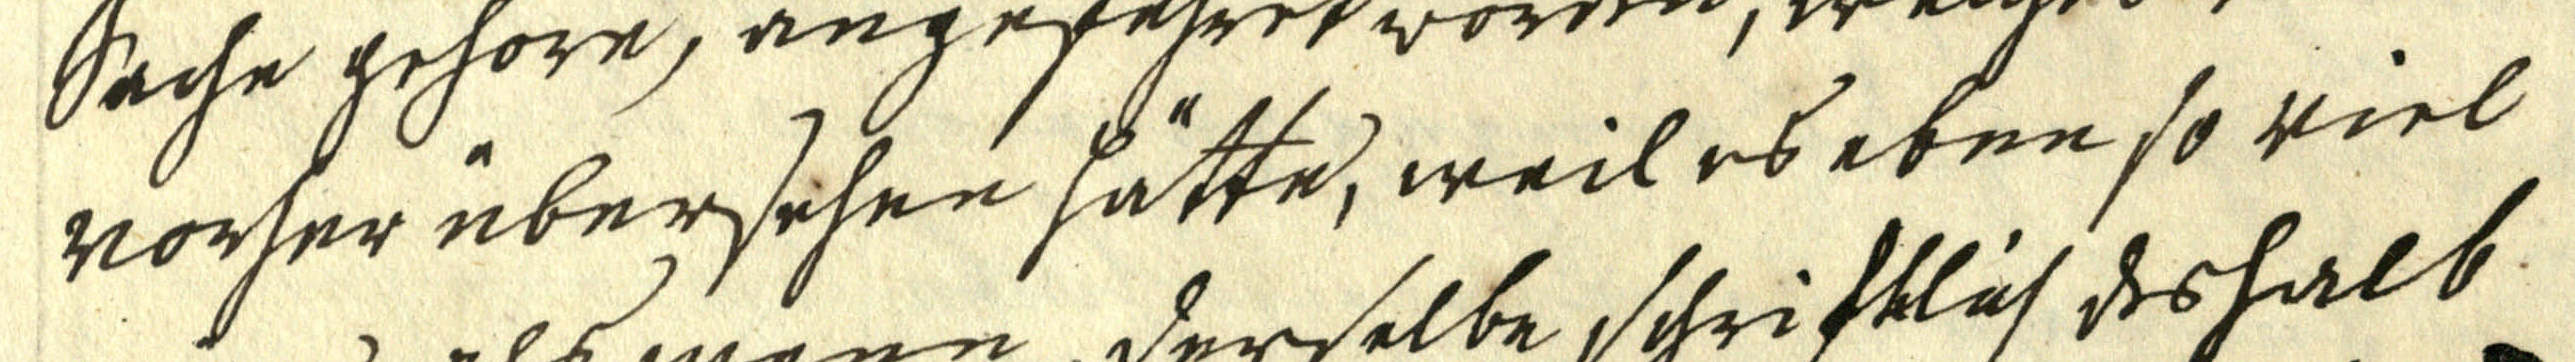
vorher übersehen hätte, weil es eben so viel
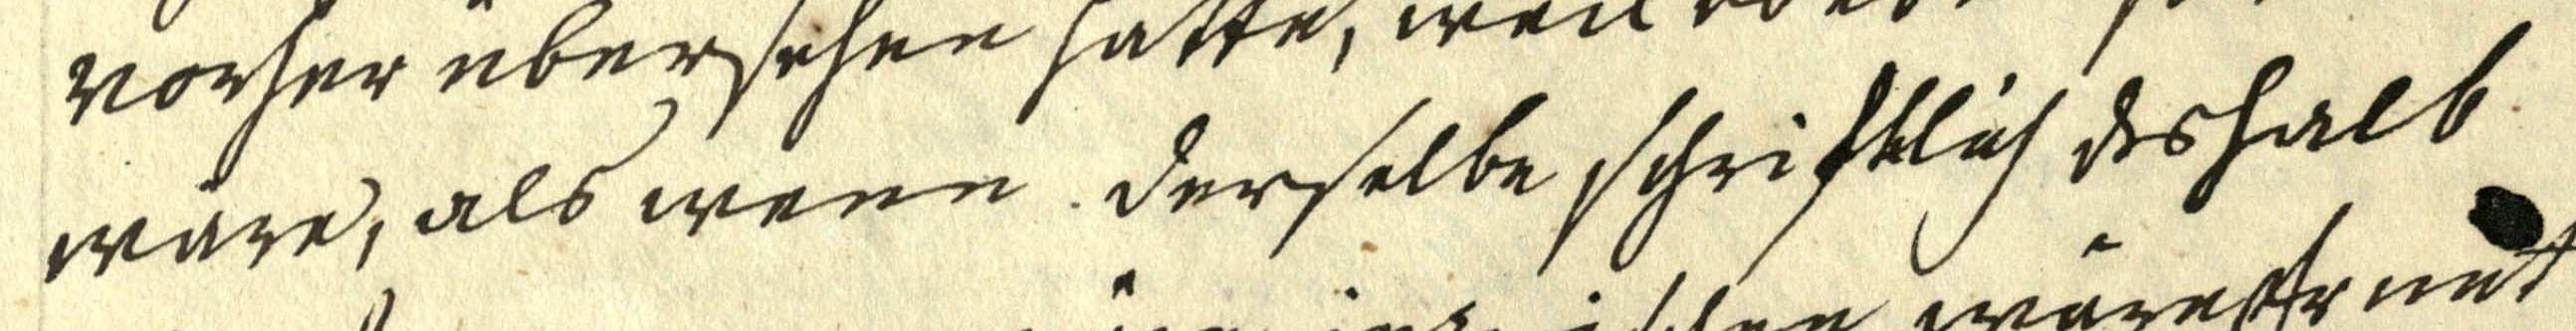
wäre, als wenn derselbe schriftlich deshalb
